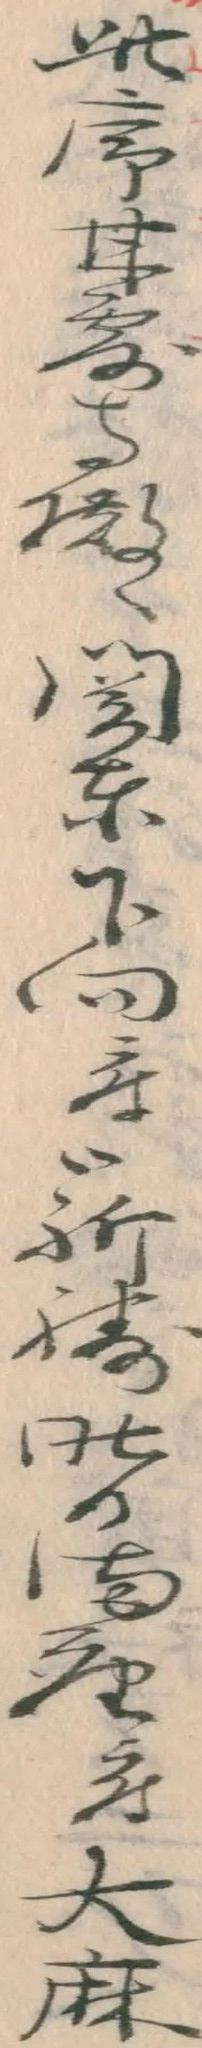此序甘露寺殿へ関東下向ニ付御祈祷明日満座ニ付大麻
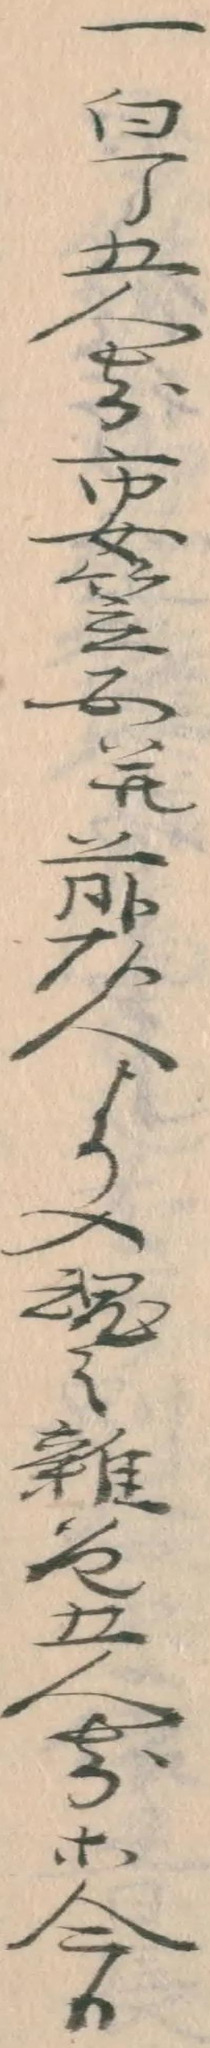一白丁五人前市女五并前頭人より入魂之雑色五人寄等今日
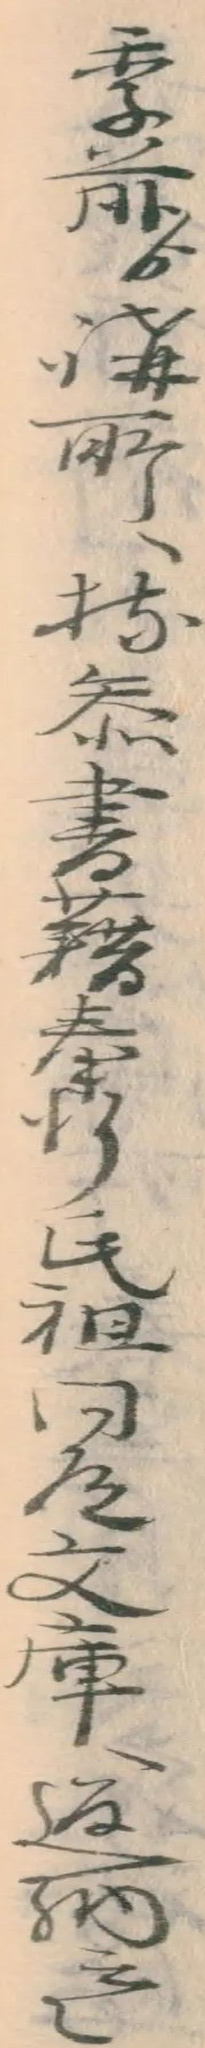季前ゟ講所へ持参書籍奉行氏祖同道文庫へ返納云々
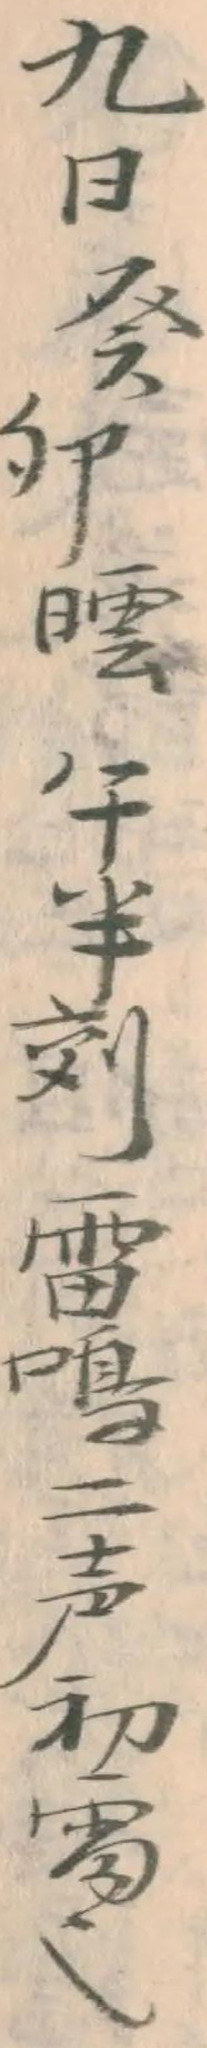九日癸申曇午半刻雷鳴二声初雷也
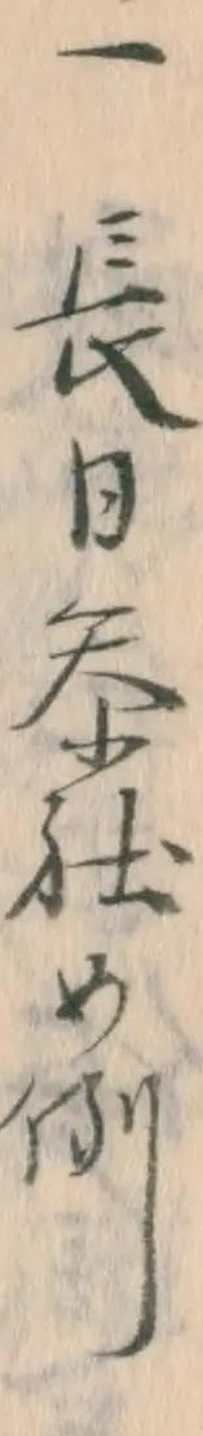一長日参社如例
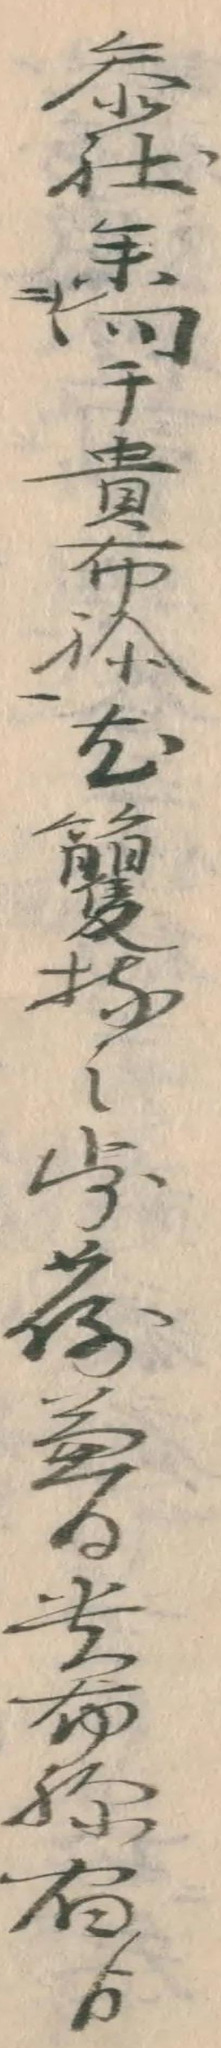参社参向于貴布祢尤籰持之歩如例兼日貴布孫宿ゟ
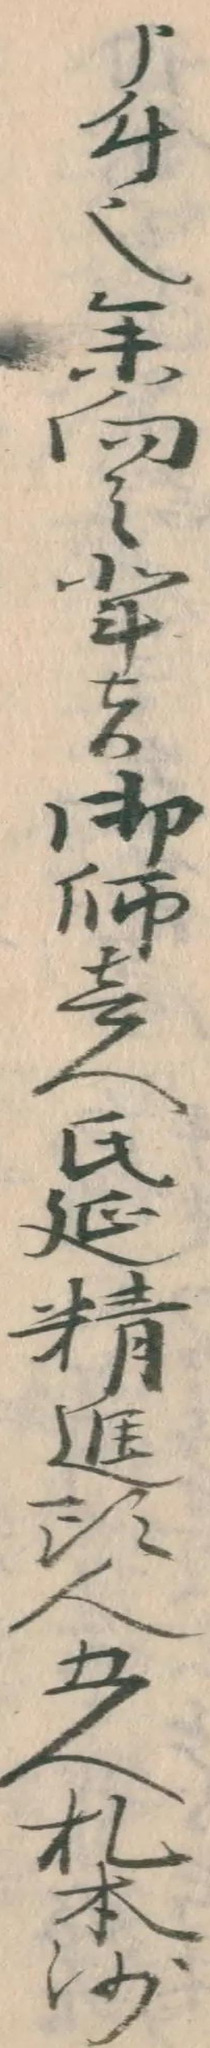申付也参向之輩は御師壱人氏延精進頭人五人札本沙
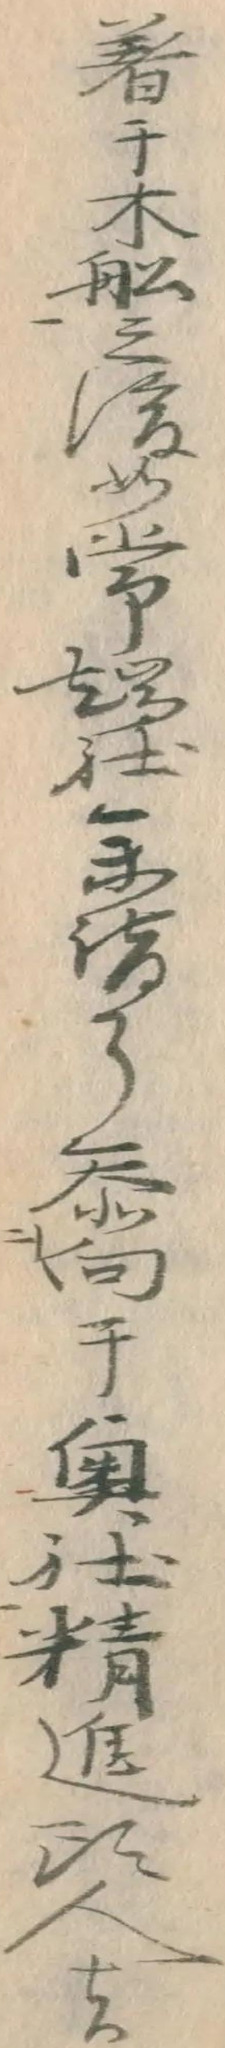着于木舩之後如常端社参詣了添向于奥社精進頭人は

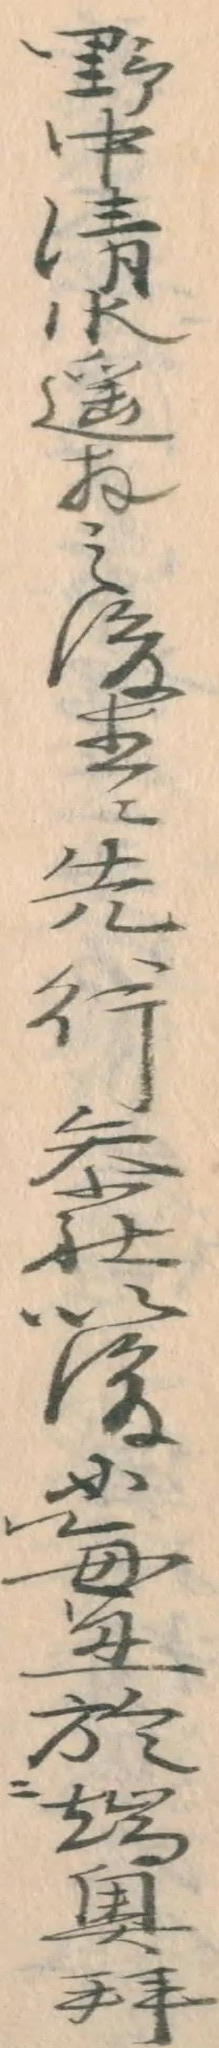野中清水遥拝之後直ニ先行参社以後如毎丑於端奥拝
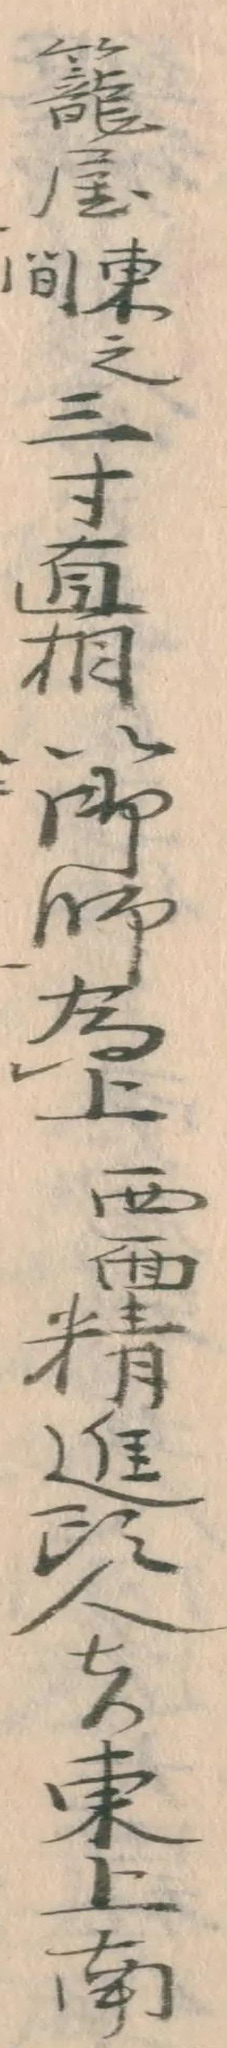籠屋東之間三寸直相以御師為上西面精進頭人は東上南
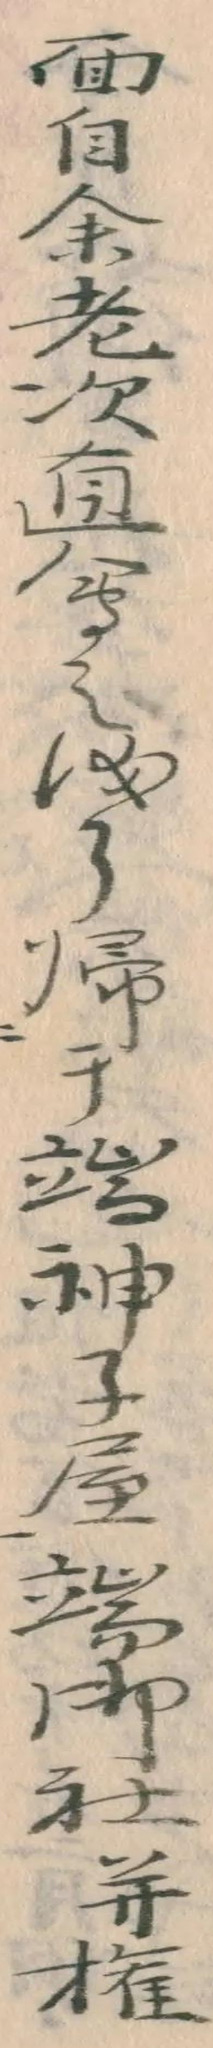面自余老次直會之儀了帰于端神子屋端御社并権
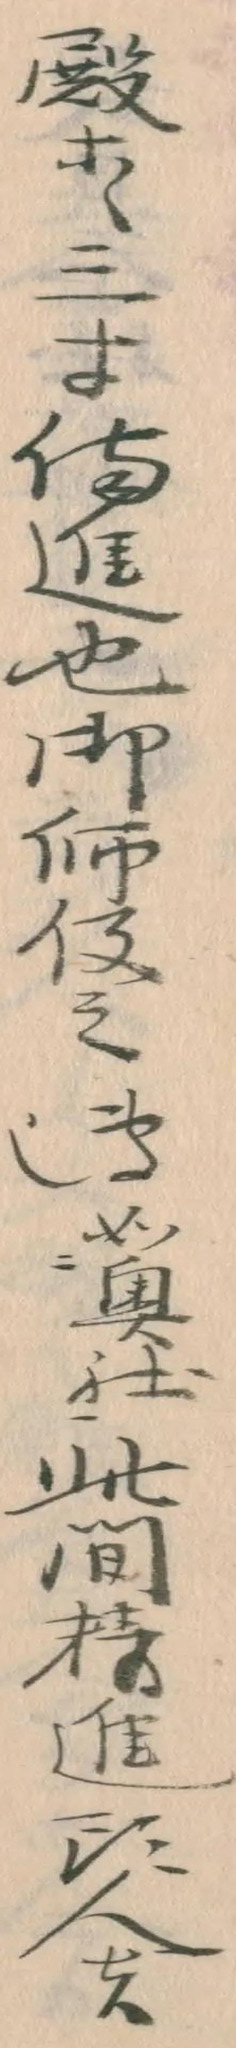殿等へ三寸備進也御師役之専如奥社也此間精進頭人は
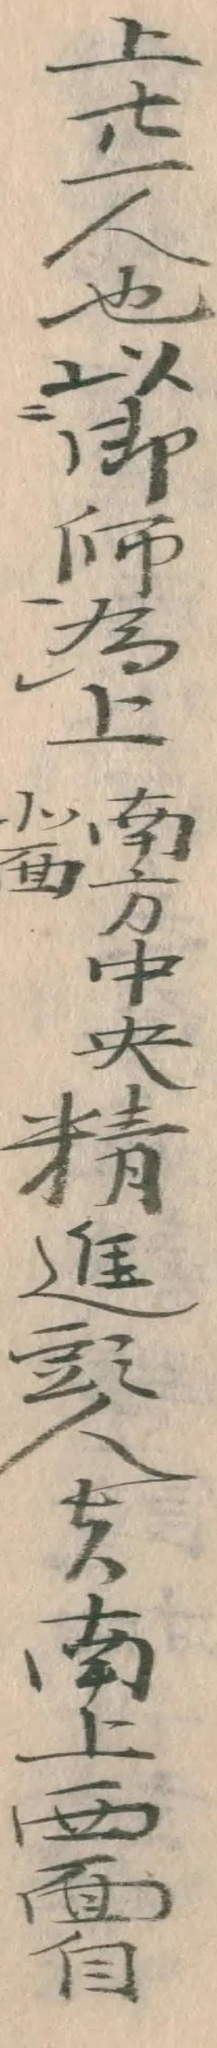上廿一人也以御師為上南方中央北面精進頭人は南上西面自
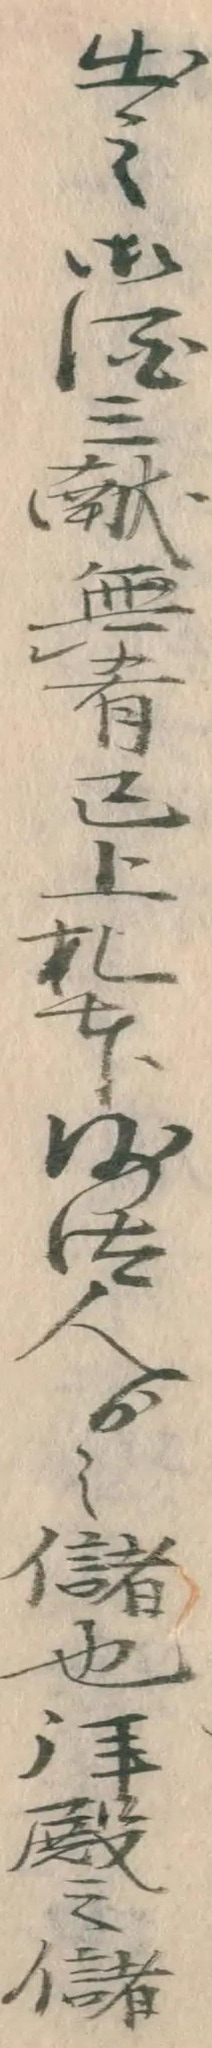出之御酒三献無肴已上札本沙汰人ゟ之儲也拝殿之儲
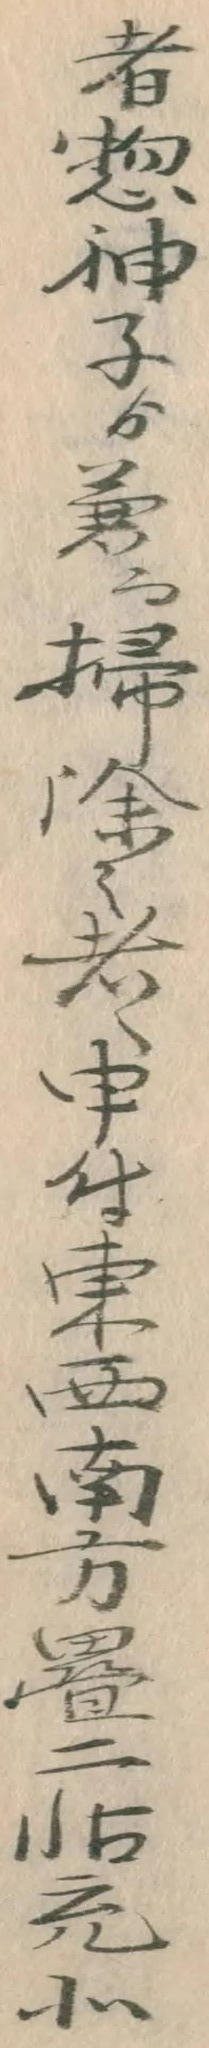者惣神子ゟ兼而掃除之者へ申付東西南方畳二帖充北

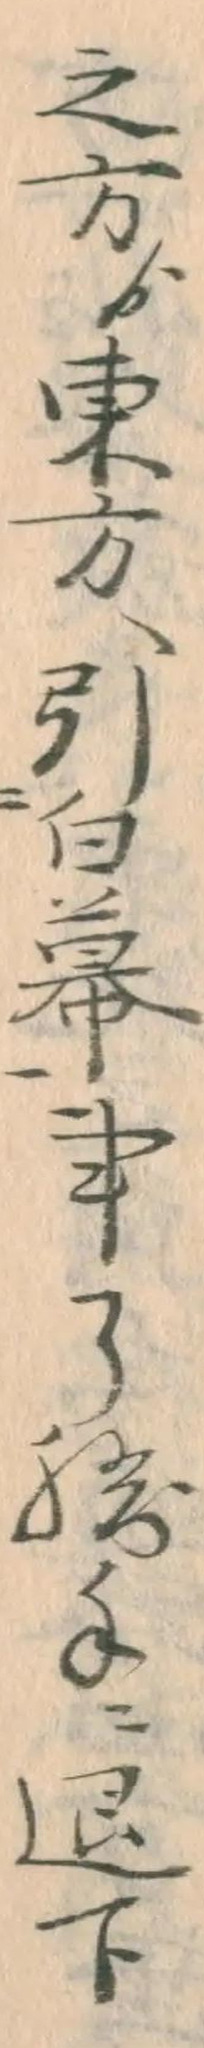之方ゟ東方へ引白幕事了勝手ニ退下
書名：賀茂社記録. 第72冊
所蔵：国立国会図書館 National Diet Library, JAPAN
